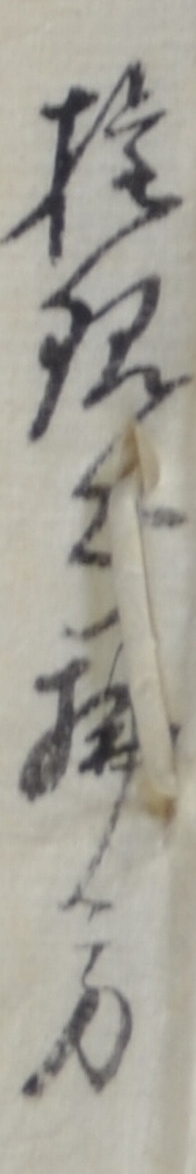権現分払方
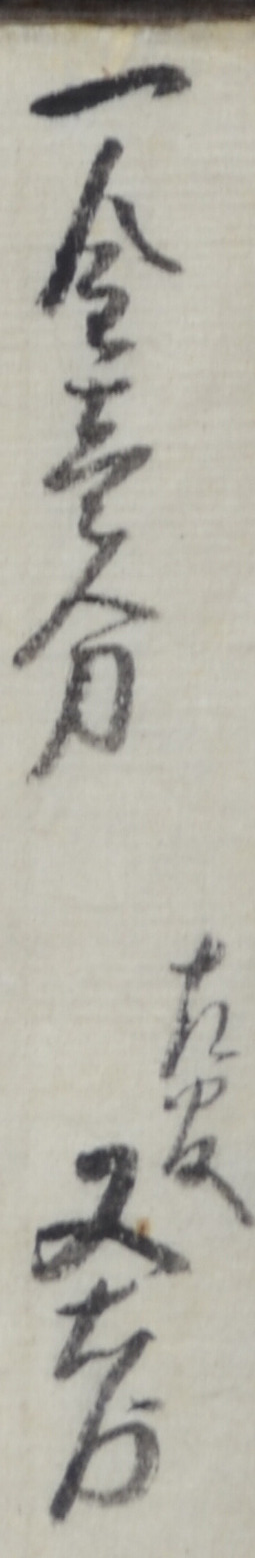一金壱分又右衛門
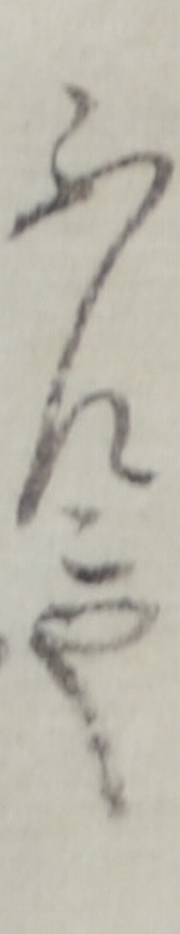ふんこや
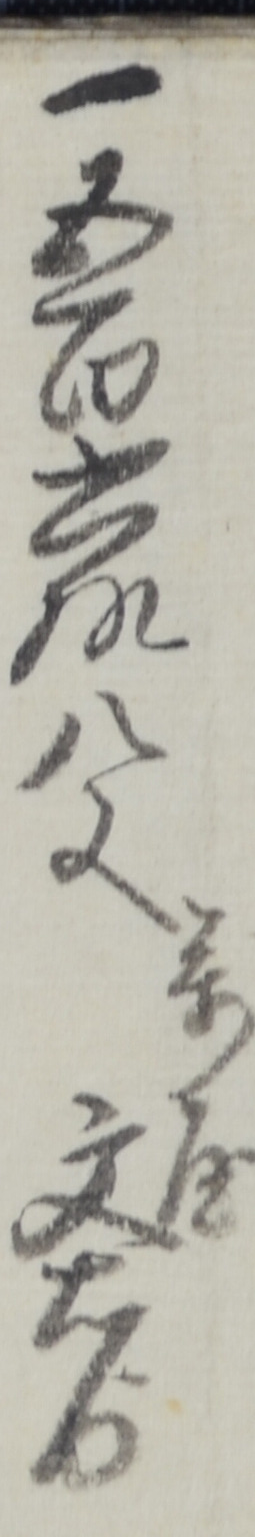一五百六拾八文文右衛門
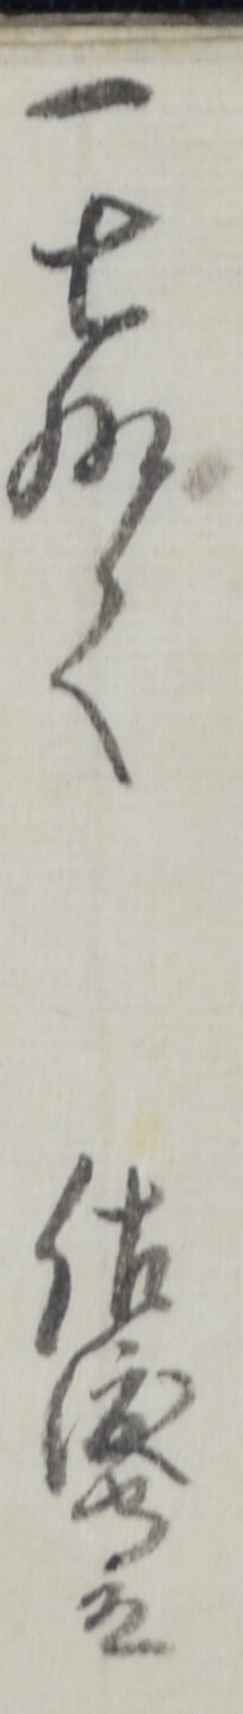一七拾文佐渡守殿
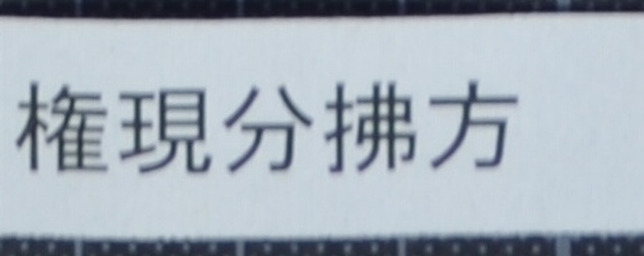権現分払方
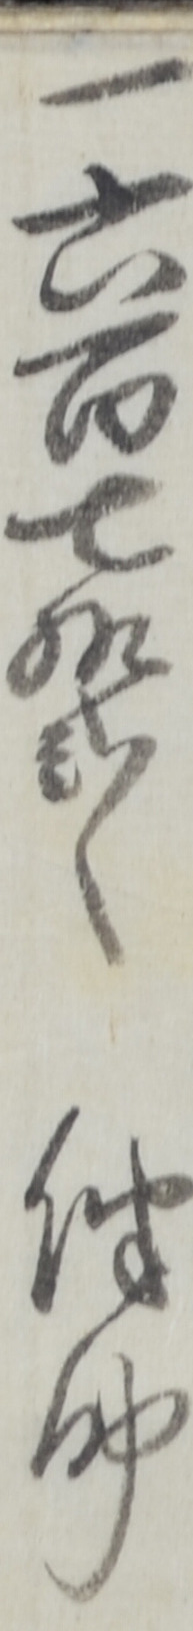一六百七拾弐文伴助
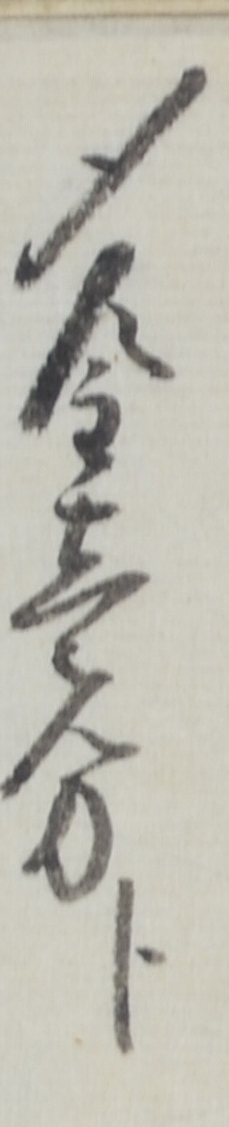〆金壱分ト
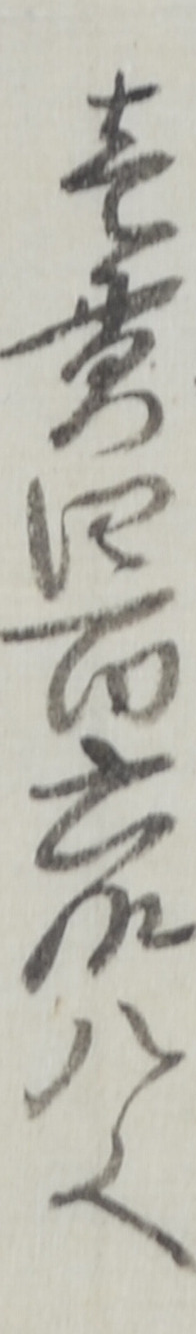壱貫四百六拾八文
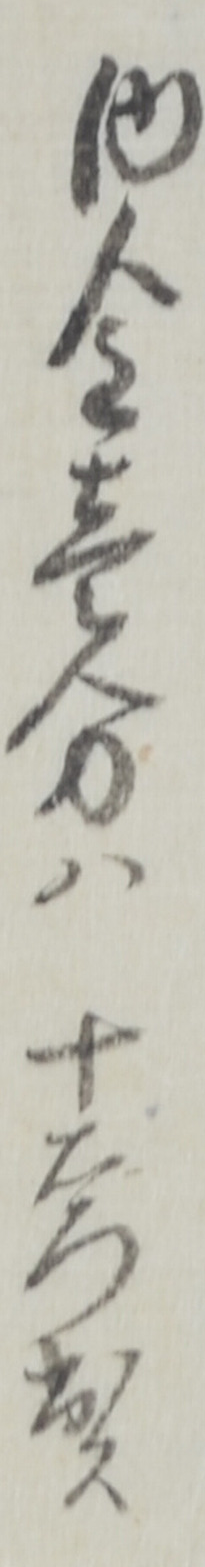内金壱分ハ十右衛門出ス
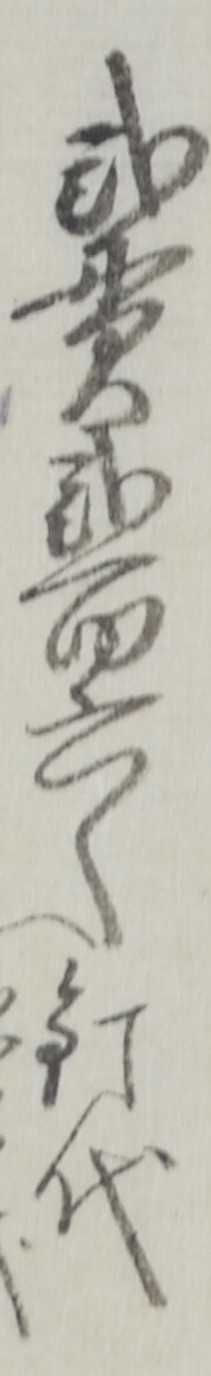弐貫弐百六文釘代
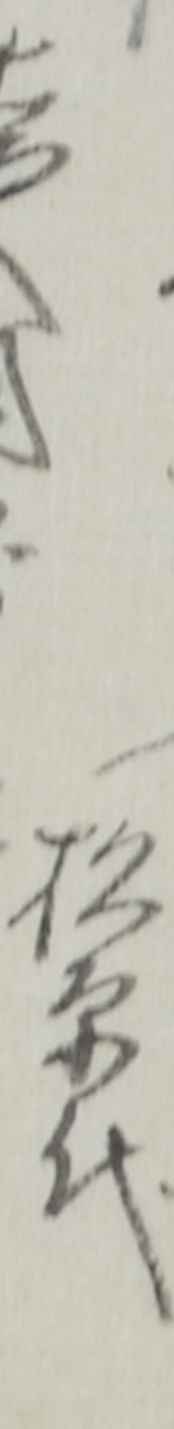杉原代
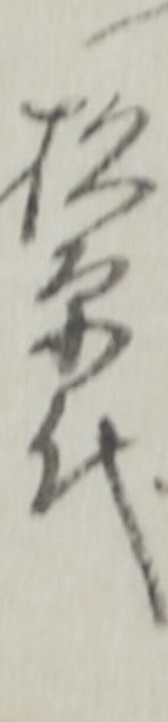杉原代
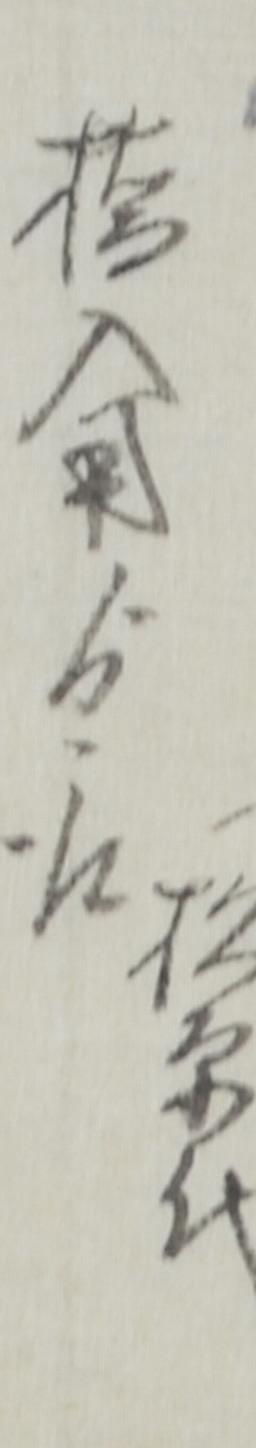橋入用ゟ取
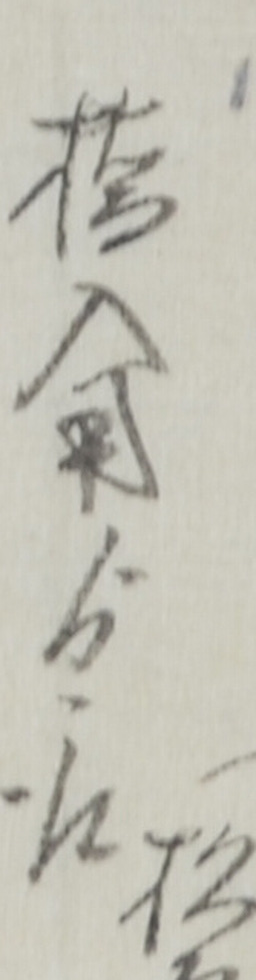橋入用ゟ取
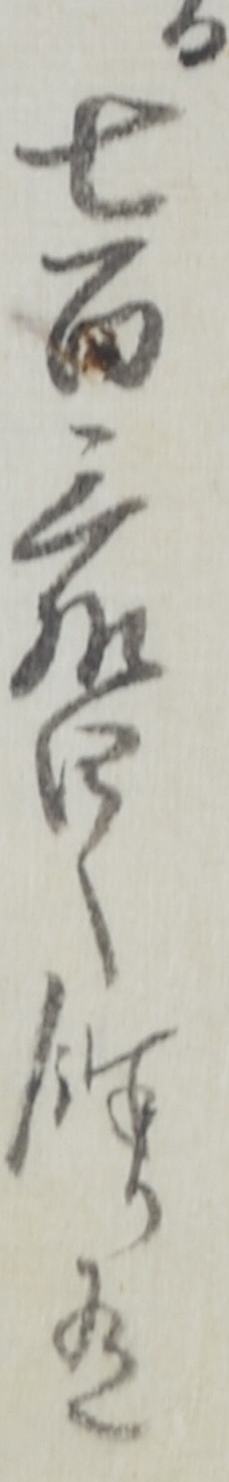七百三拾四文餘り有
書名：権現分拂方
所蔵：伊那市立高遠町図書館・合同会社AMANE
